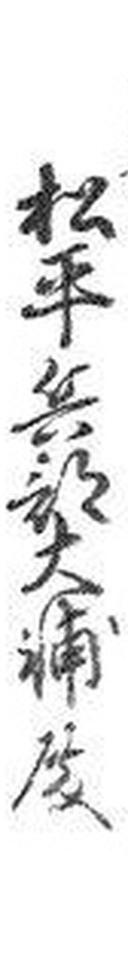松平兵部大輔殿正永
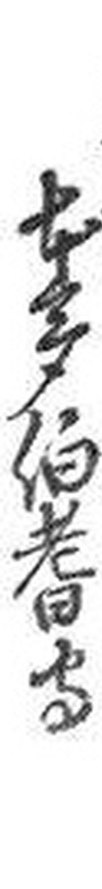本多伯耆守
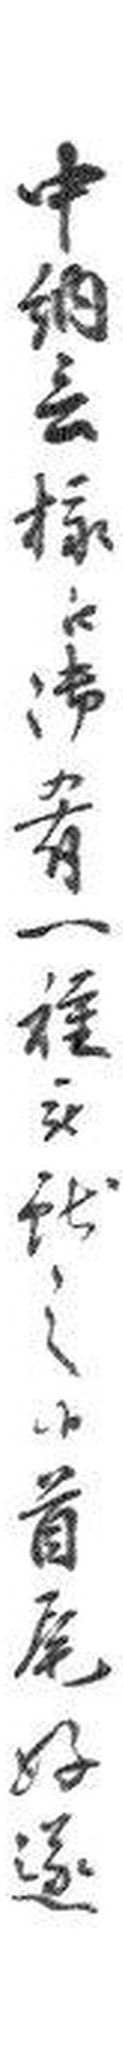中納言様江御肴一種被献之候首尾好遂
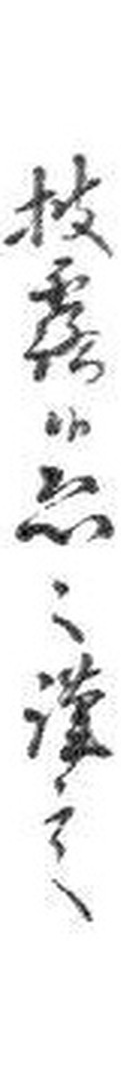披露候恐々謹言
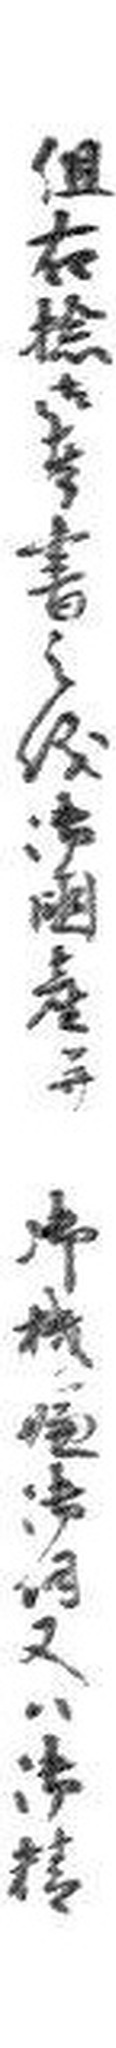但右捻御奉書之儀御国産并御機嫌御伺又ハ御精
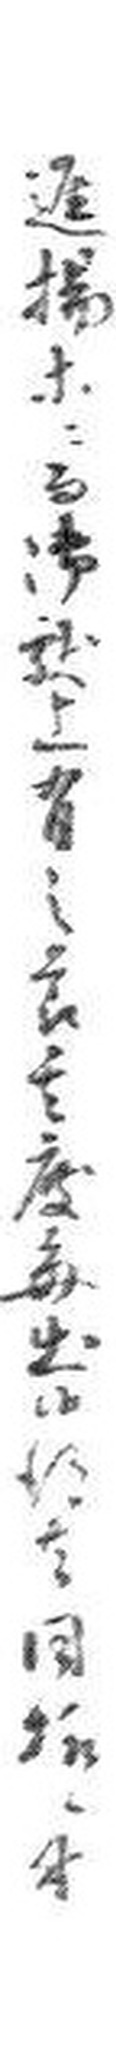進揚等ニ而御献上有之節其度毎出候得共同様ニ付
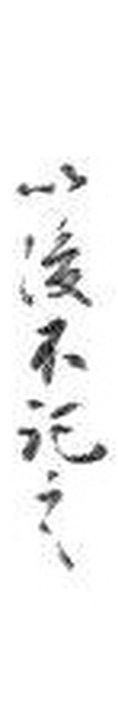以後不記之
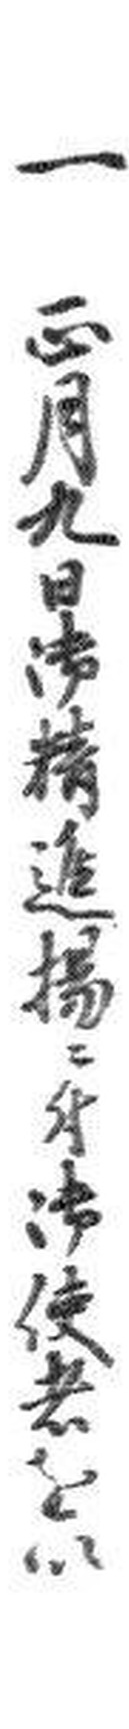一正月九日御精進揚ニ付御使者を以
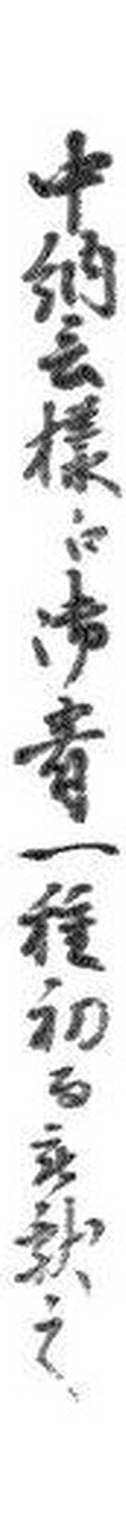中納言様江御肴一種初而被献之
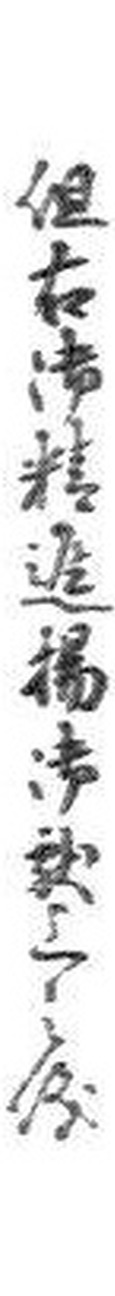但右精進揚御献上之儀
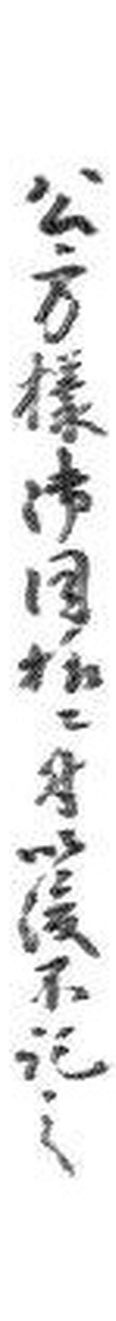公方様御同様ニ付以後不記之
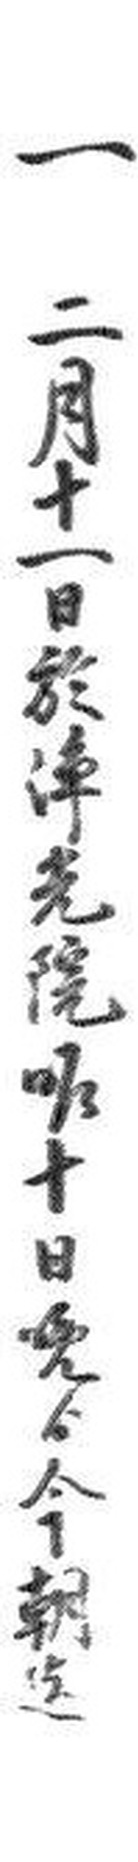一二月十一日於浄光院昨十日晩ゟ今朝迄
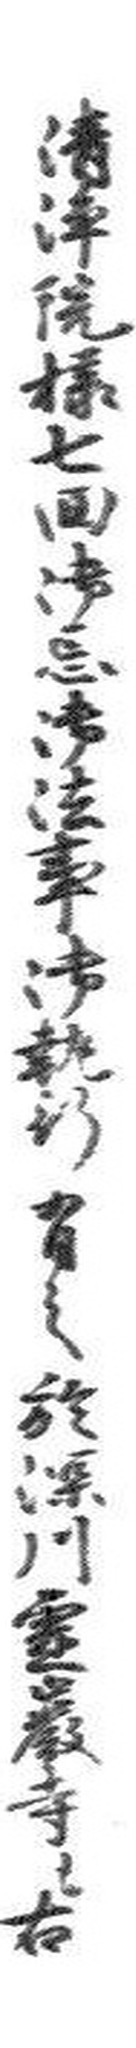清浄院様七回御忌御法事御執行有之於深川霊厳寺も右

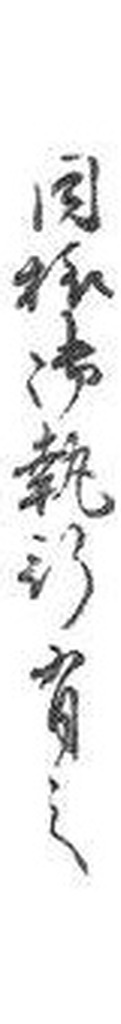同様御執行有之
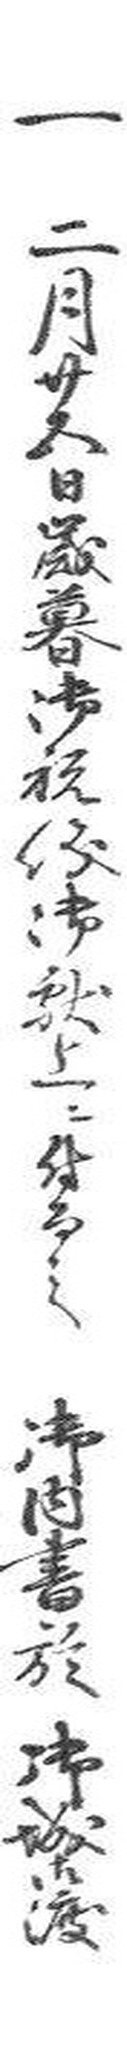一二月廿五日歳暮御祝儀御献上ニ付而之御内書於御城御渡
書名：家譜 二十三 吉品公 従宝永元年到同二年
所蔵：福井県文書館 Fukui Prefectural Archives
